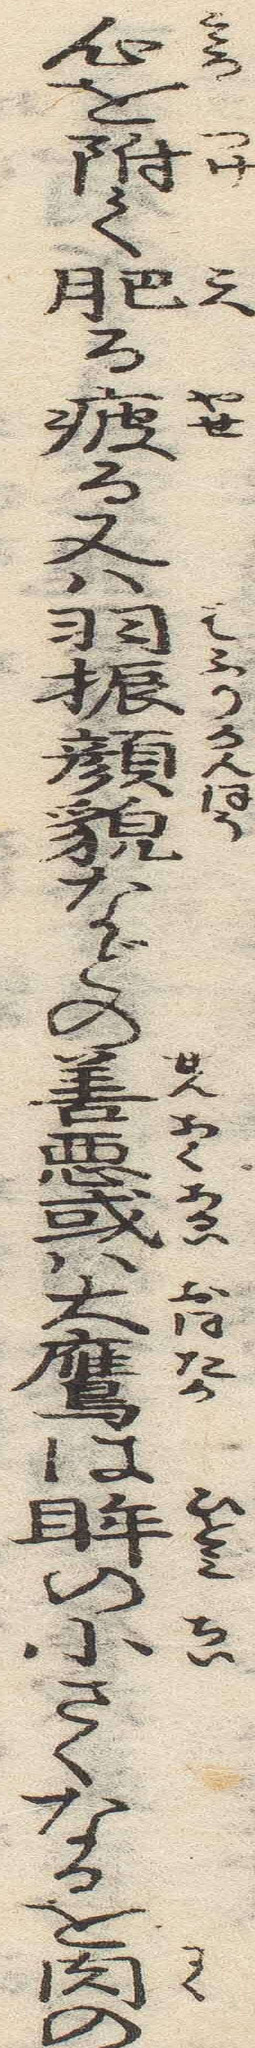心を附て肥る痩る又は羽振顔貌などの善悪或は大鷹は眸の小さくなるを肉の
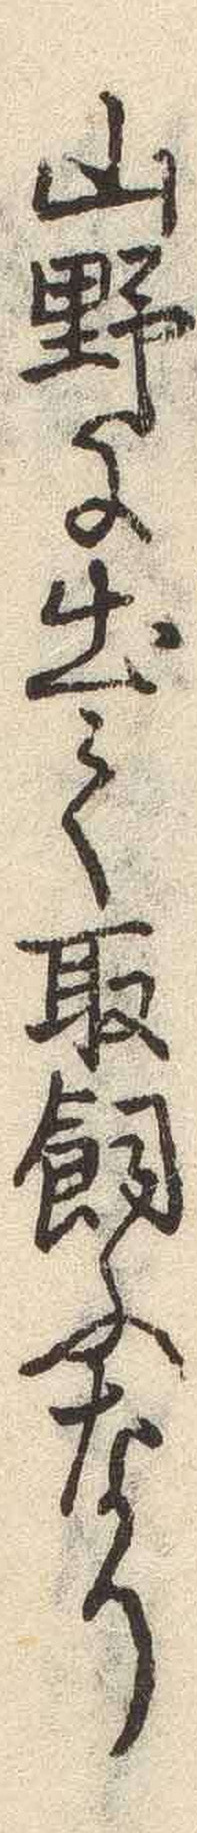山野に出て取飼ふなり
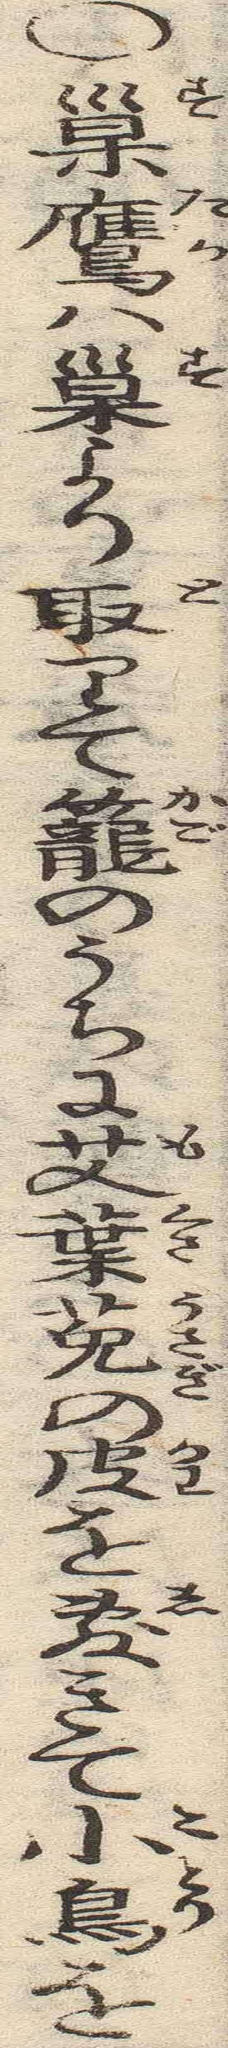○巣鷹は巣より取りて籠のうちに艾葉兎の皮を敷きて小鳥を
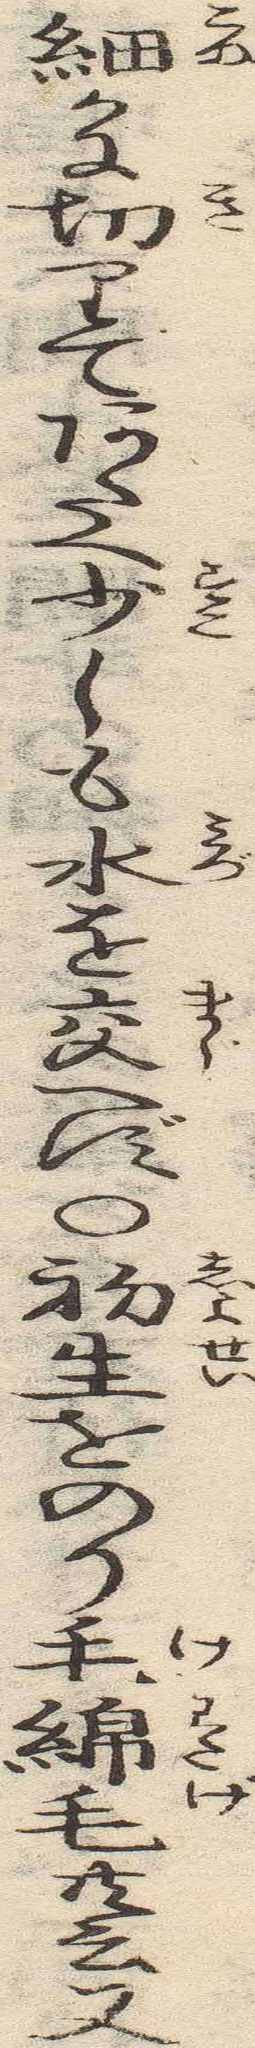細かに切りてあたへ少しも水を交へず○初生をのり毛綿毛共云又
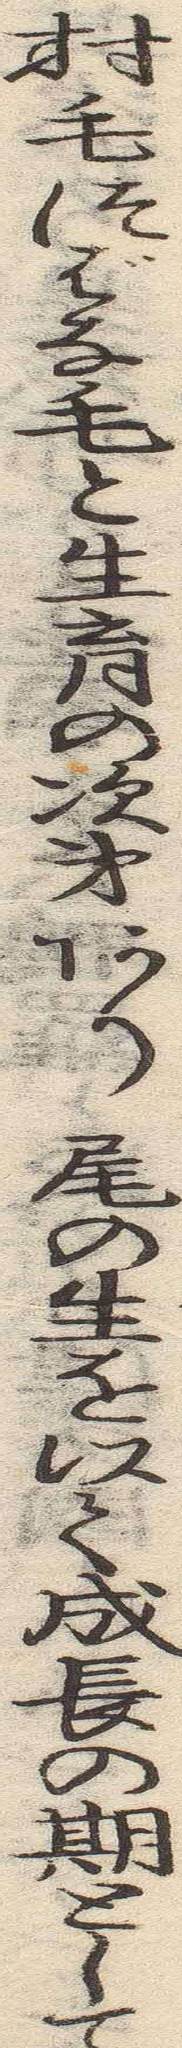村毛つばな毛と生育の次第あり尾の生を以て成長の期として
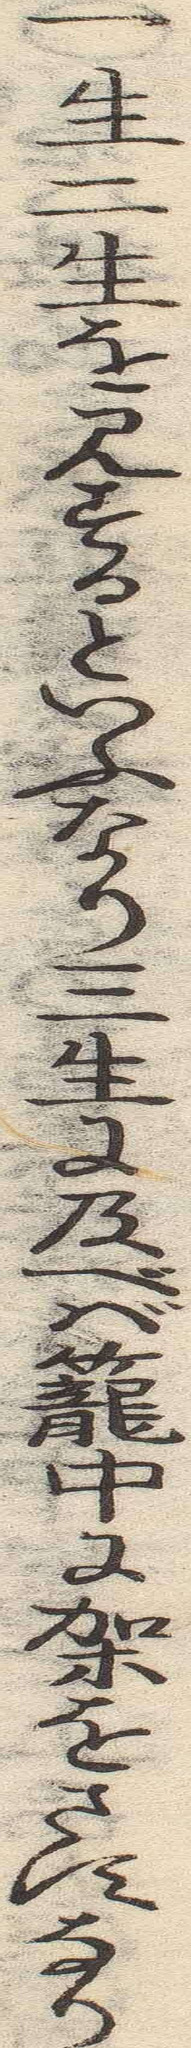一生二生を見するといふなり三生に及べば籠中に架をさすなり
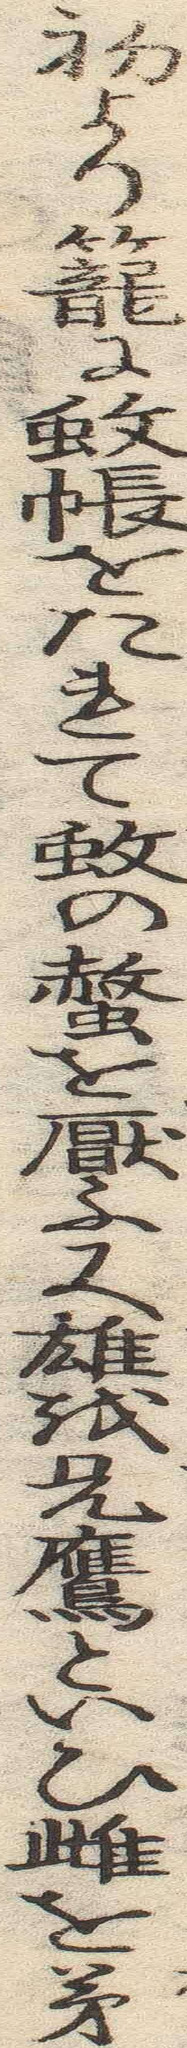初より籠に蚊帳をたれて蚊の螫を厭ふ又雄を兄鷹といひ雌を弟
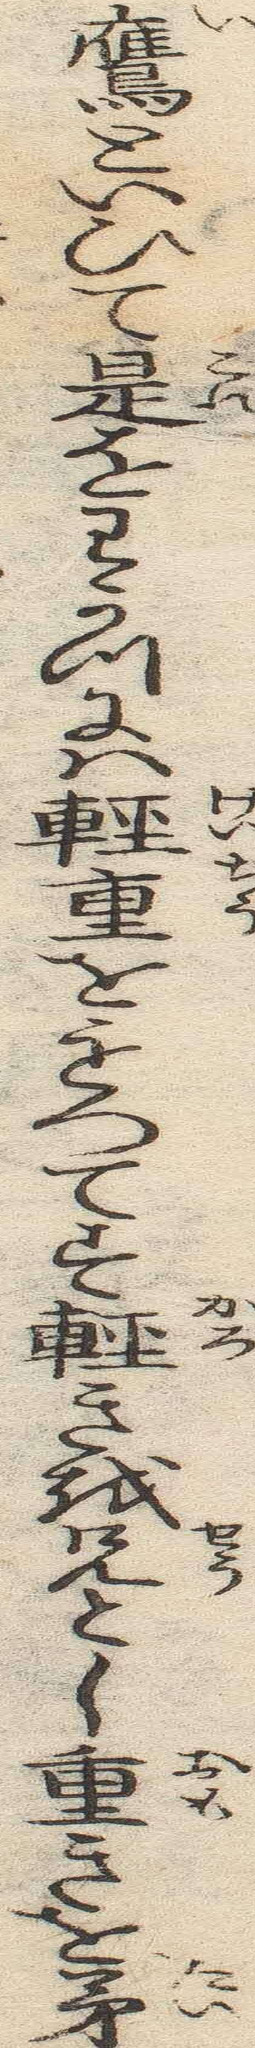鷹といひて是をわかつには軽重をもつてす軽きを兄とし重きを弟
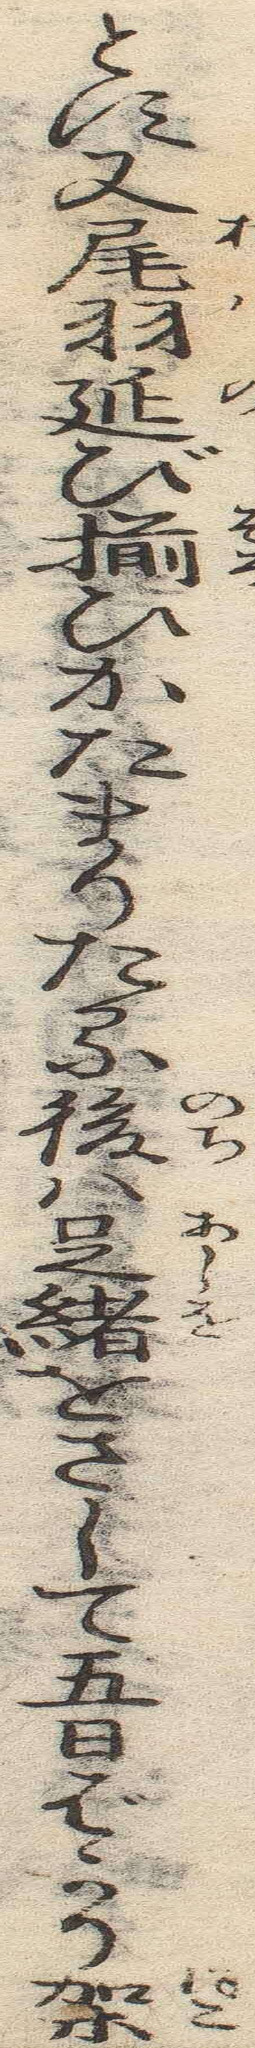とす又尾羽延び揃ひかたまりたる後は足緒をさして五日ばかり架
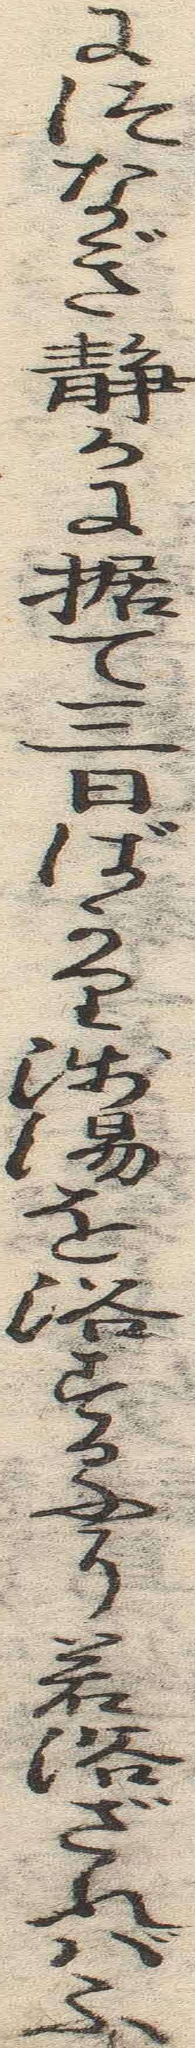につなぎ静かに据て三日ばかり浅湯を浴するふに若浴ざればふ
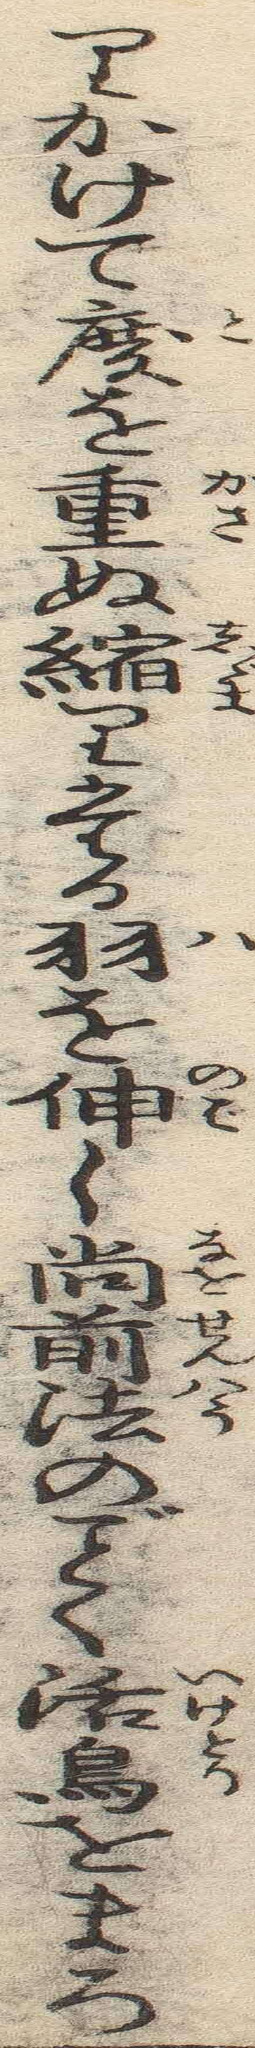りかけて度を重ぬ縮りたる羽を伸し尚前法のごとく活鳥をまろ
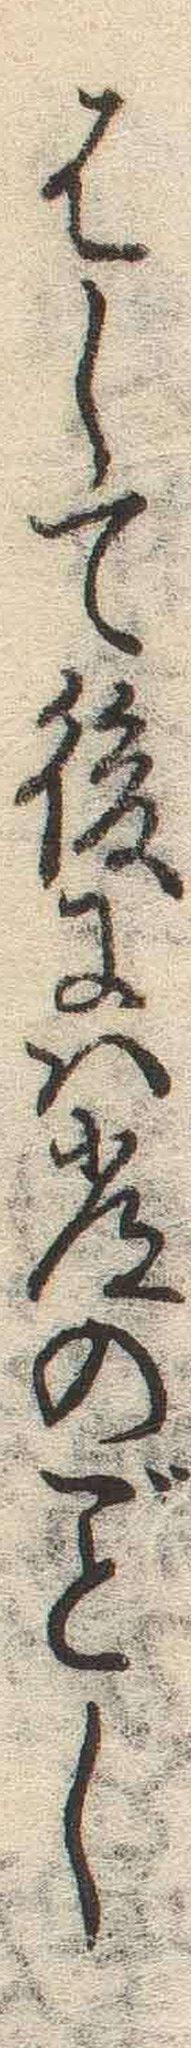はして後には常のごとし
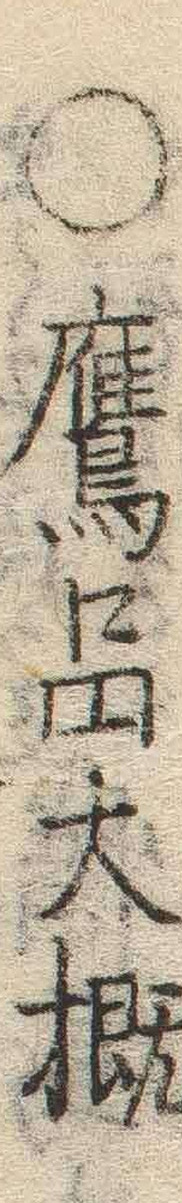○鷹品大概

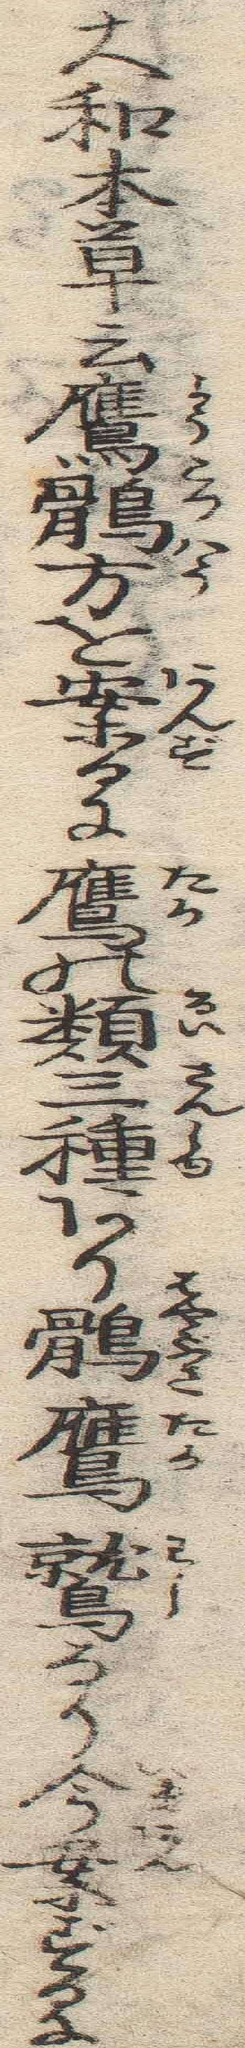大和本草云鷹鶻方を案るに鷹の類三種あり鶻鷹鷲なり今案ずるに
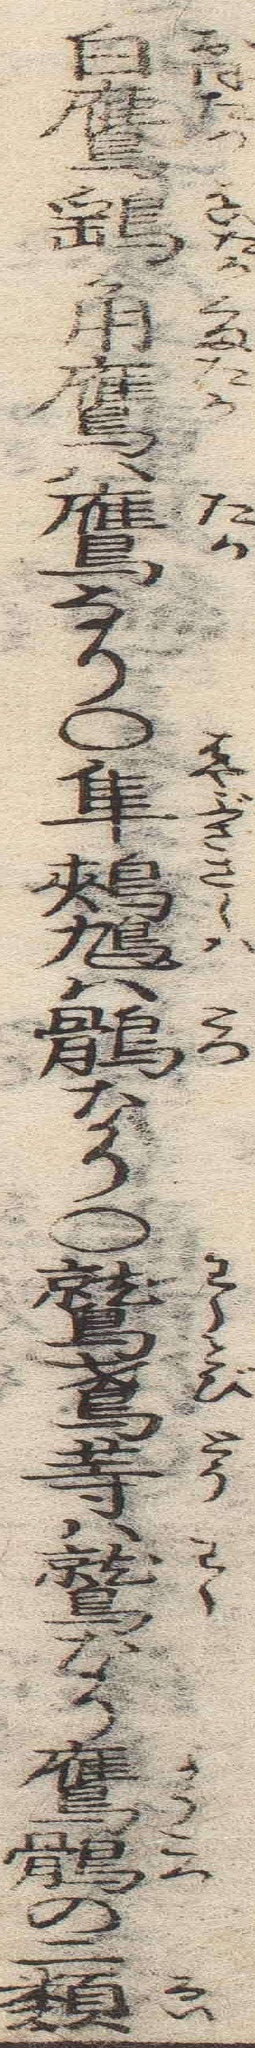白鷹鷂角鷹は鷹なり○隼鶆鳩は鶻なり○鷲鳶等は鷲なり鷹鶻の二類
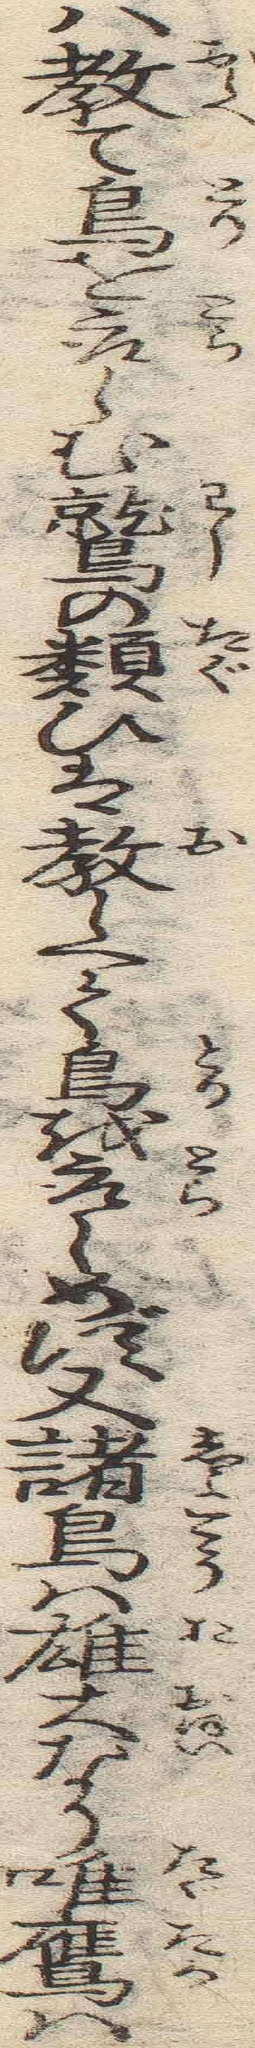は教て鳥を取しむ鷲の類ひは教しへて鳥を取しめず又諸鳥は雄大なり唯鷹は
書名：日本山海名産図会
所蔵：東京学芸大学附属図書館 国文学研究資料館
